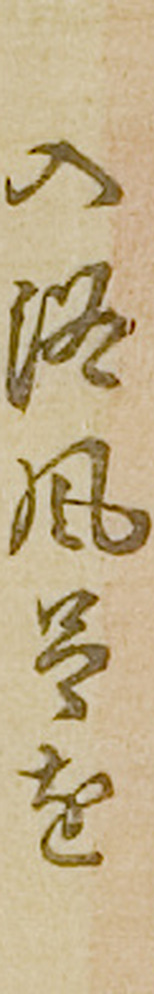入浴風呂を
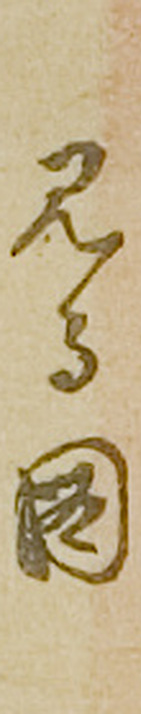見る図
